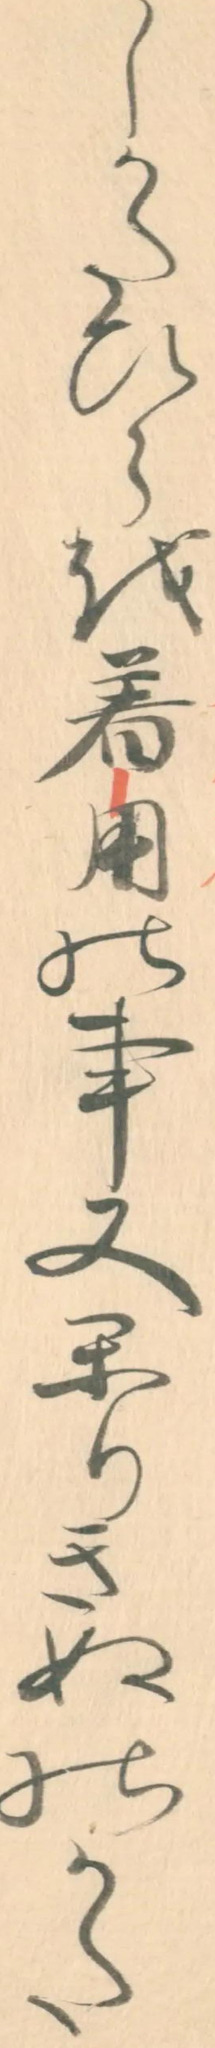しかたひらを着用の事又かりきぬのかた
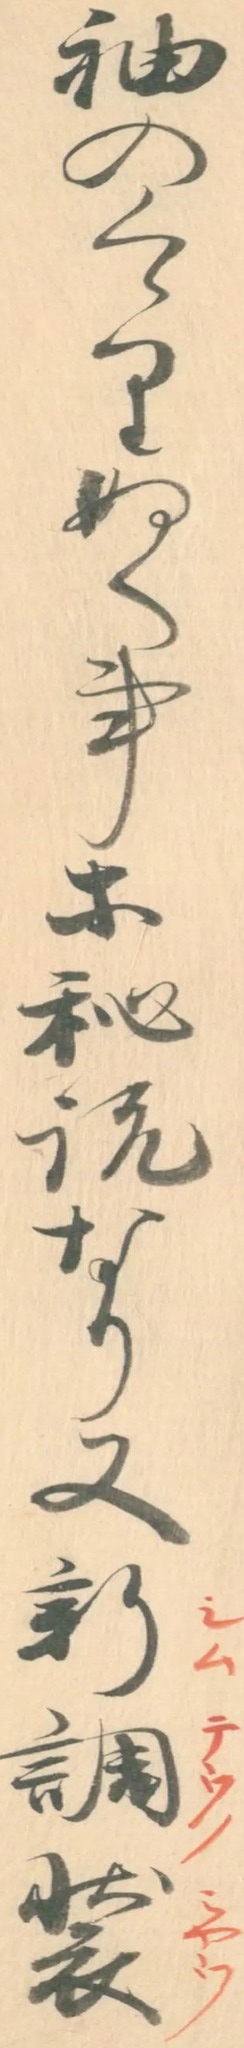袖のくゝりをぬく事等秘説なり又新調装

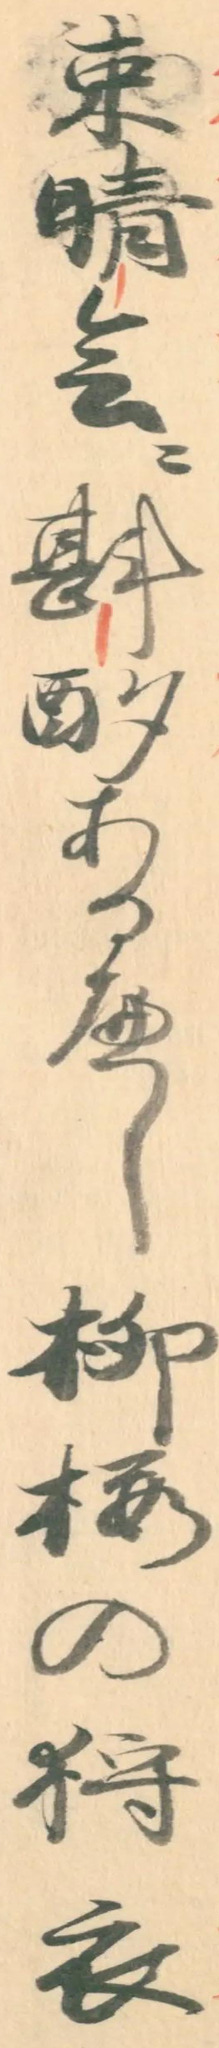束晴会に斟酌あるへし栁桜の狩衣
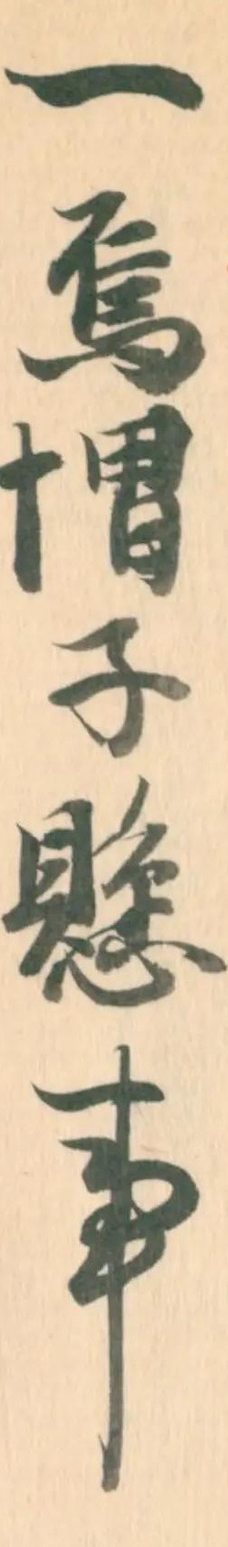一烏帽子懸事
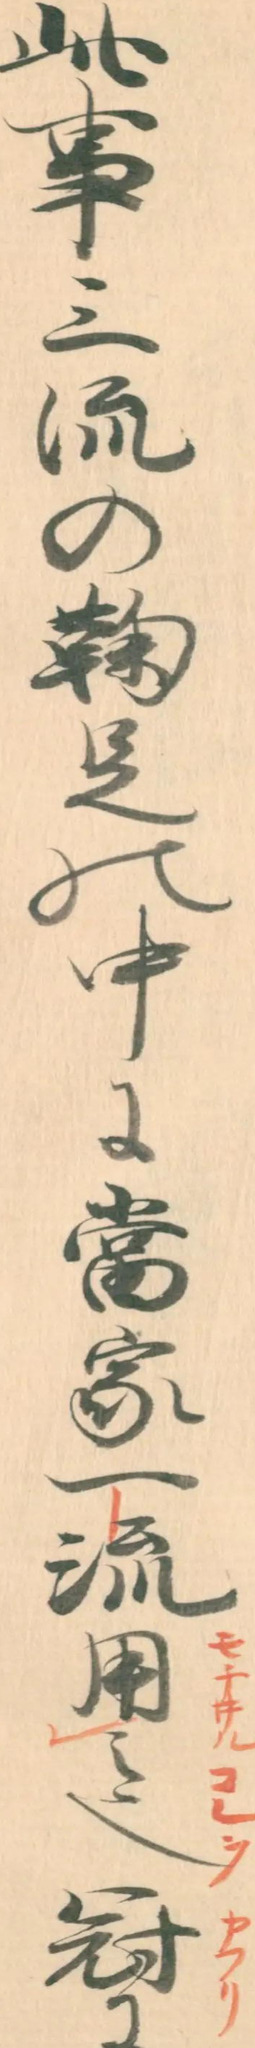此の頃事三流の鞠是の中に當家一流用之冠に
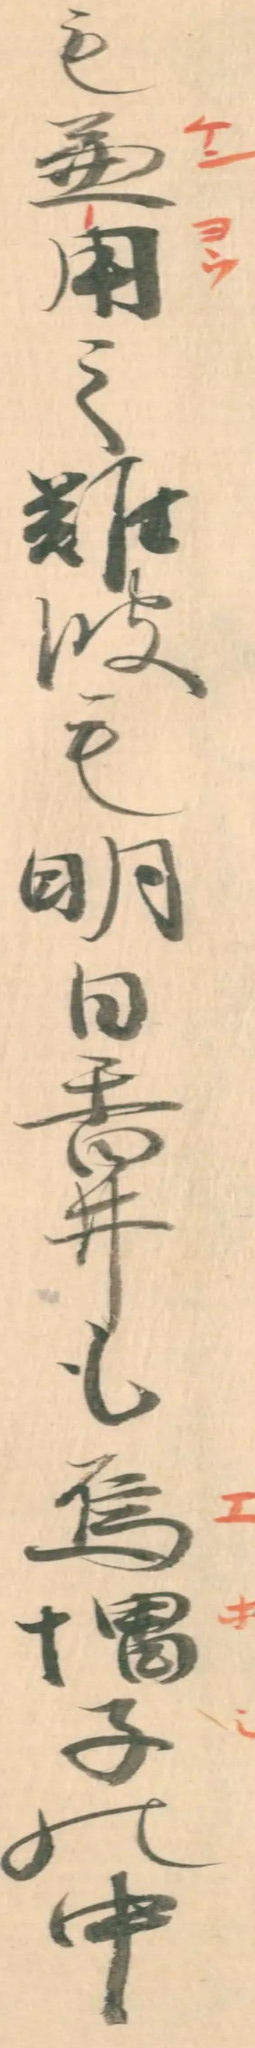も兼用之難波も明日香井も烏帽子の中
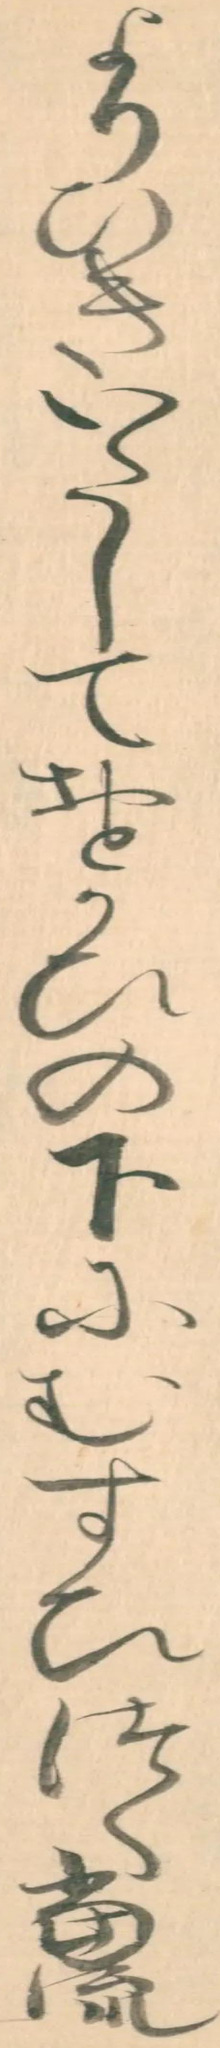よりひきいたしておとかひの下にむすひつゝ當流
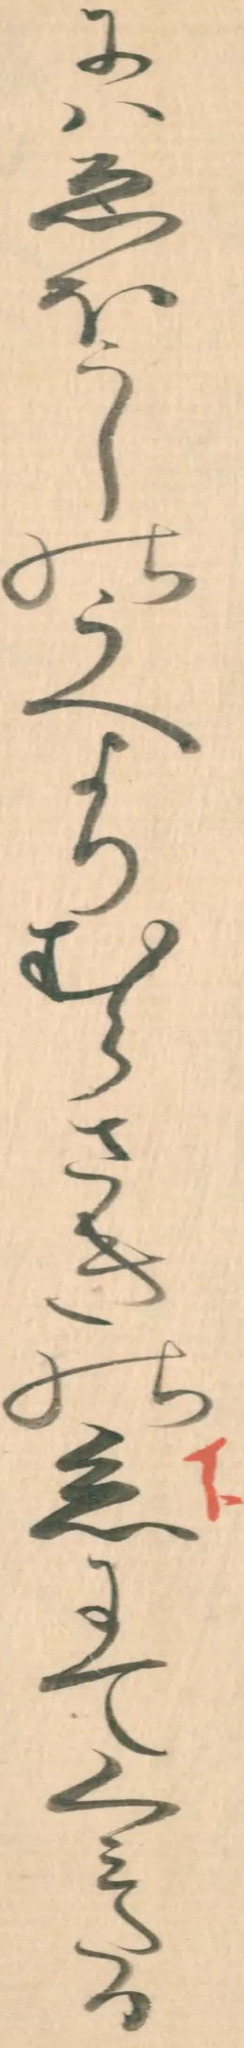にはゑほうしのうへよりむらさきの糸にてくみたる
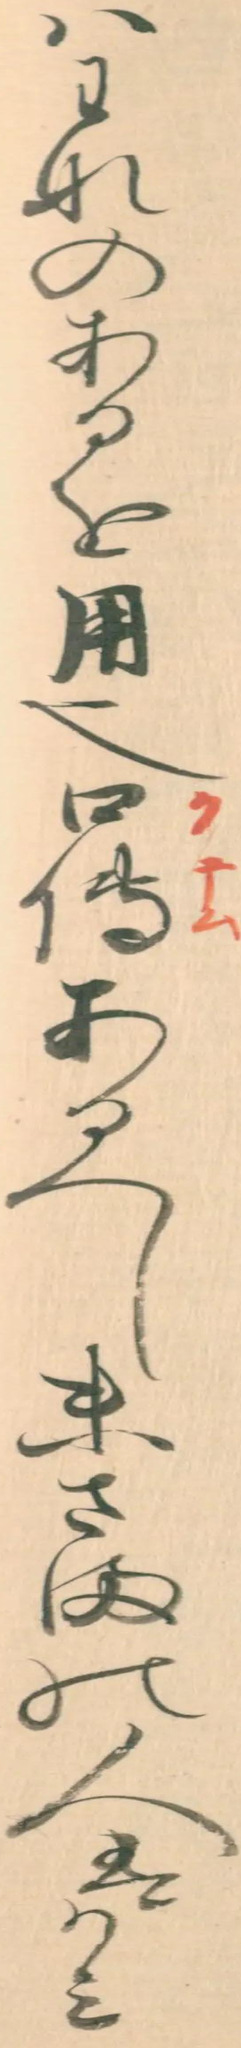ははなのあるを用也口伝あるへし末さまの人はかみ
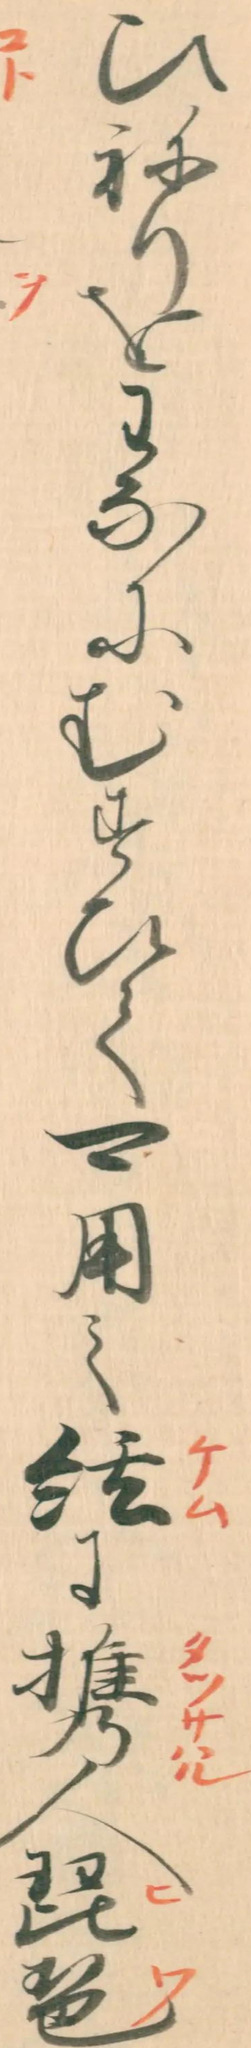ひねりをはなにむすひて可用て絃に携人琵琶
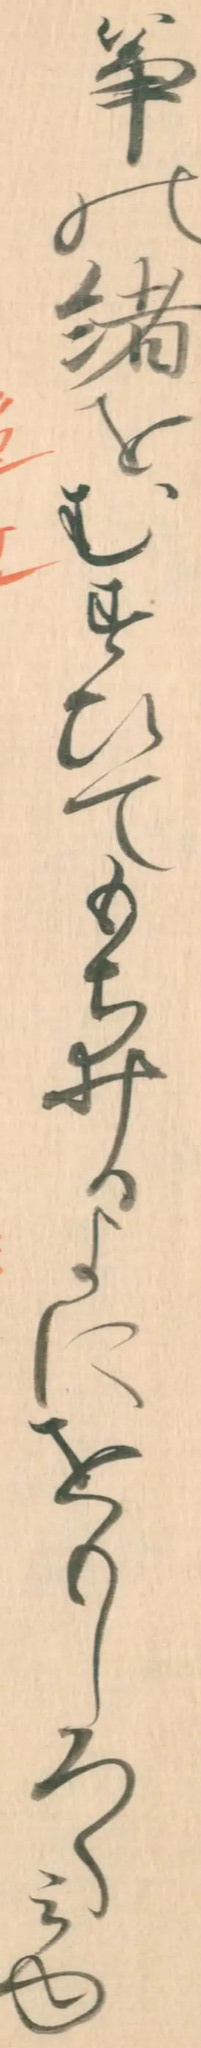箏の緒をむすひてもちゐるよにおもしろくみゆ
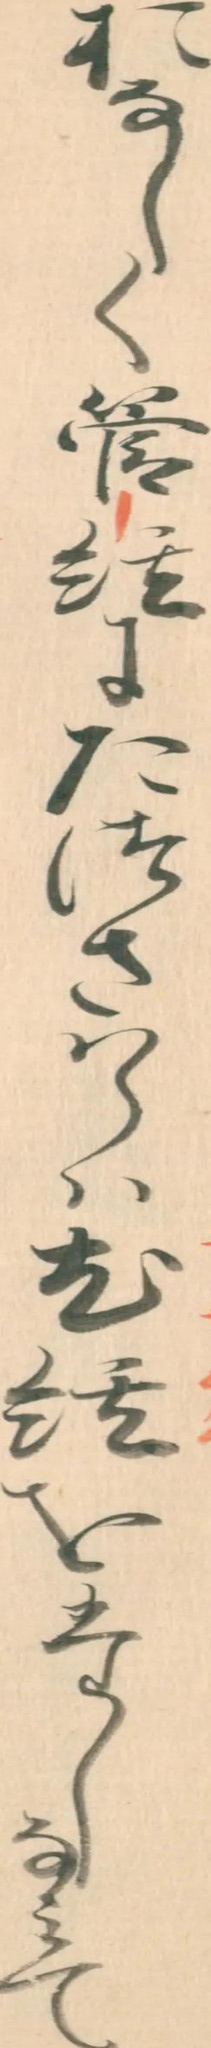おなしく管絃にたすさわらは尤絃をたしなみて
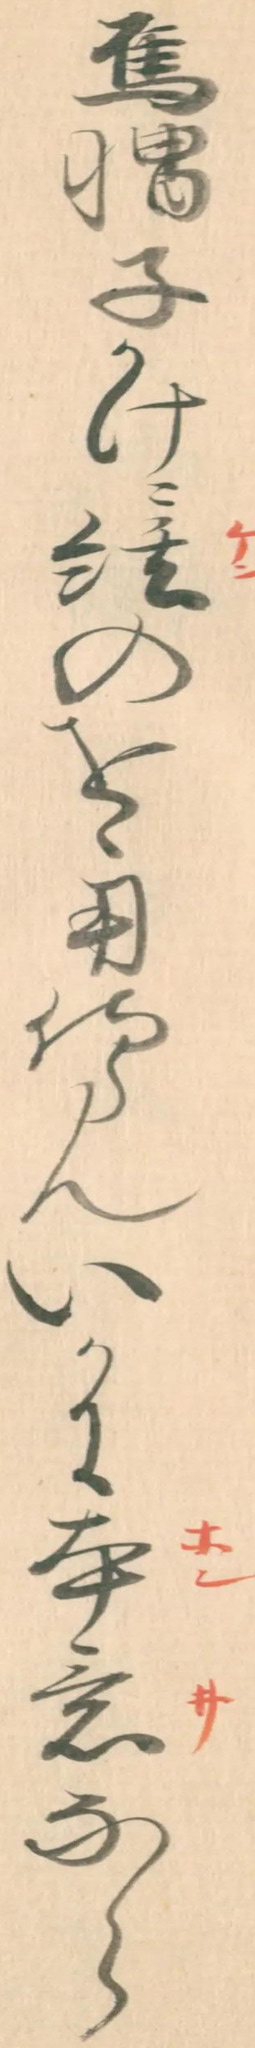烏帽子かけや絃のをゝ用侍らんいかに本意なら
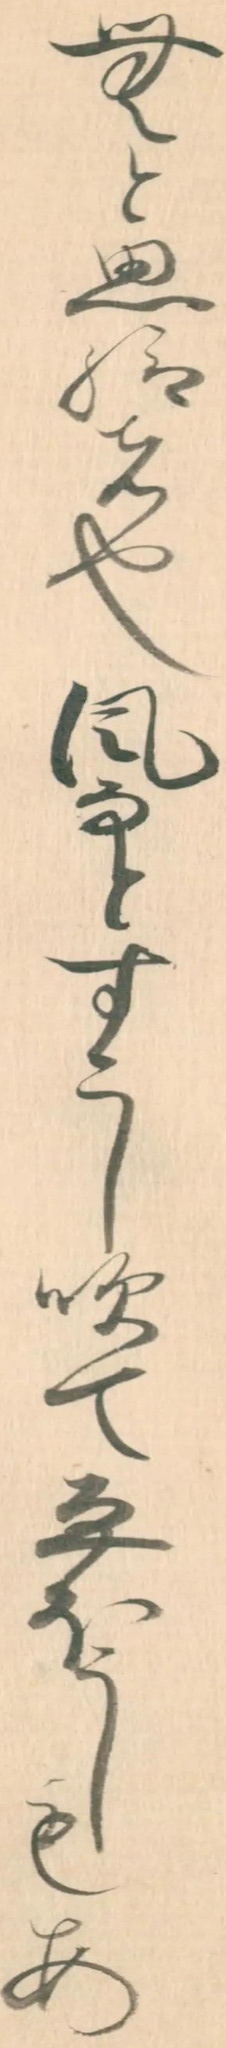むと思給者は風なとすこし吹てゑほうしもあ
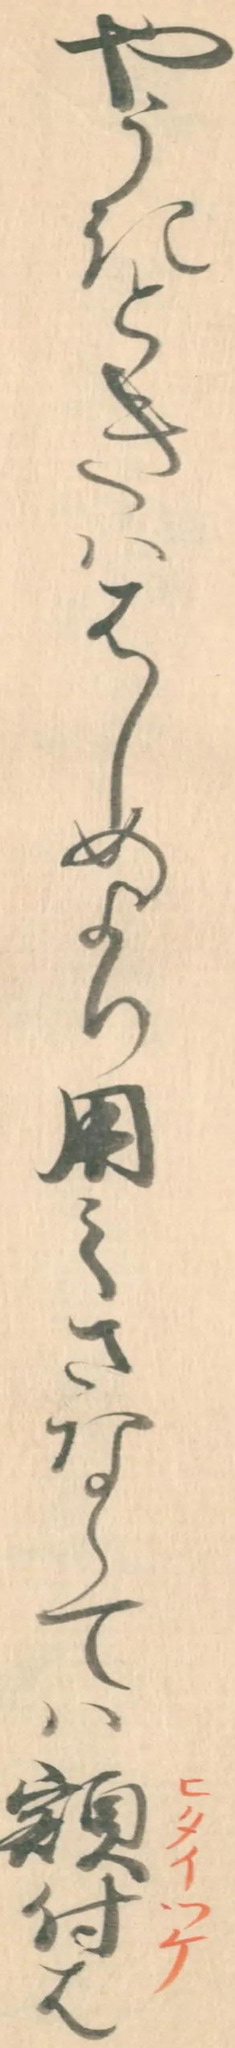やうきときははしめより用てさならては額付は
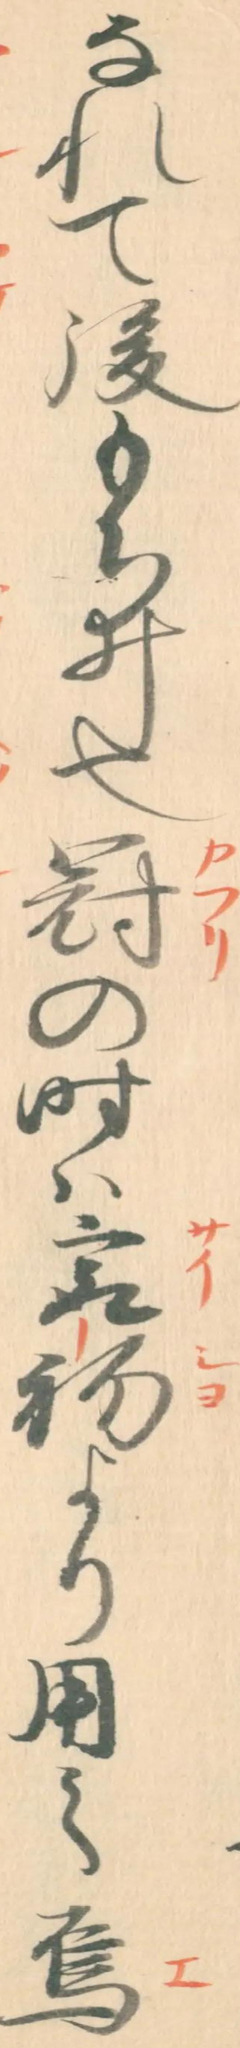なれて後もちゐなり冠の時は最初より用て烏
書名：遊庭秘抄 2巻. [1]
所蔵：国立国会図書館 National Diet Library, JAPAN
